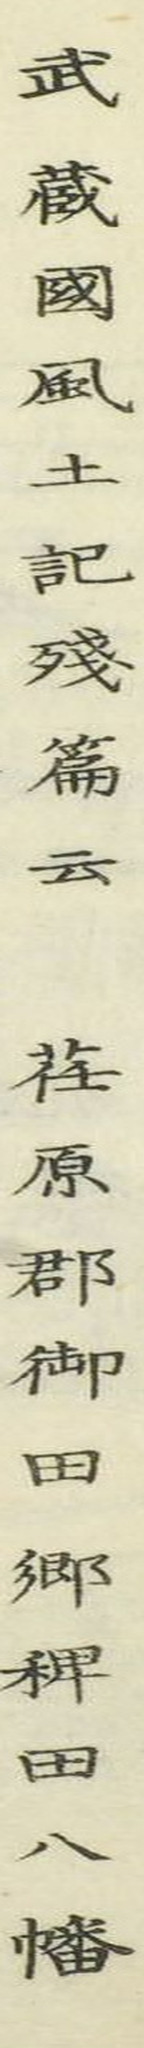武蔵國風土記残篇云荏原郡御田郷薭田八幡
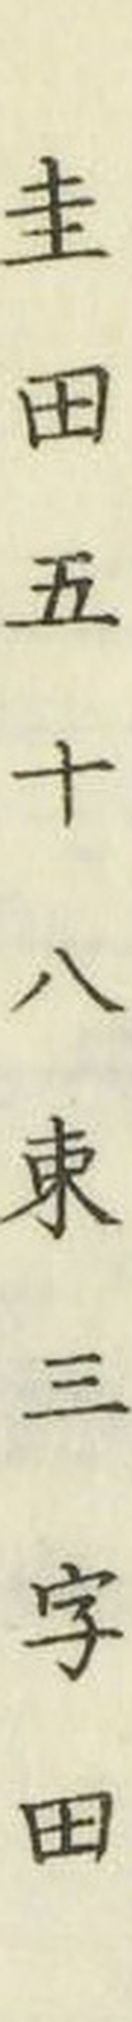圭田五十八束三字田
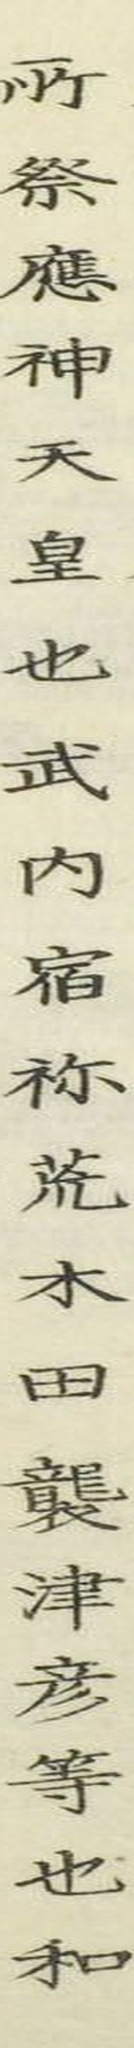所祭應神天皇也武内宿祢荒木田襲津彦等也和
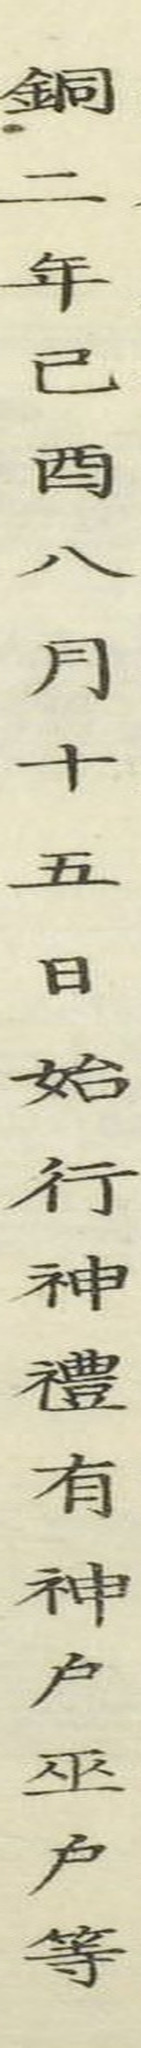銅二年己酉八月十五日始行神禮有神戸巫戸等
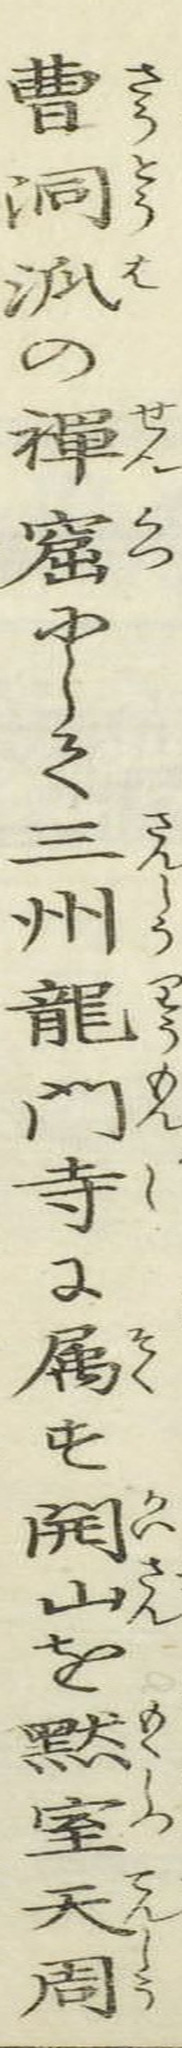曹洞派の禅窟にして三州龍門寺に属す開山を黙室天周
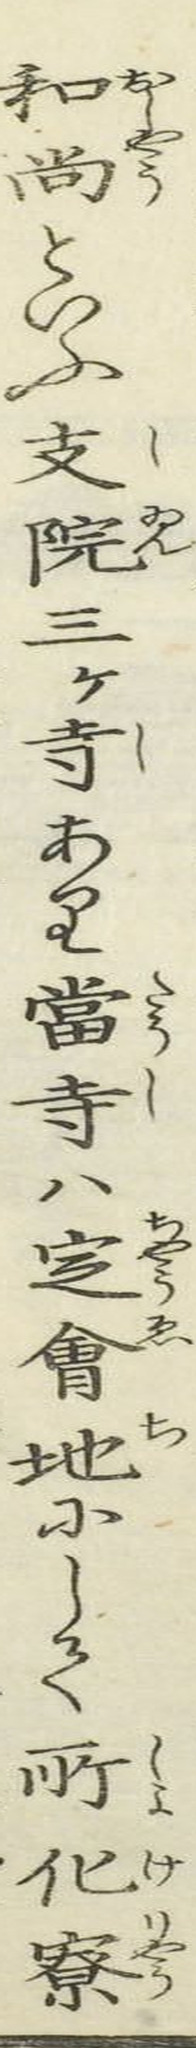和尚といふ支院三ヶ寺あり當寺は定會地にして所化寮
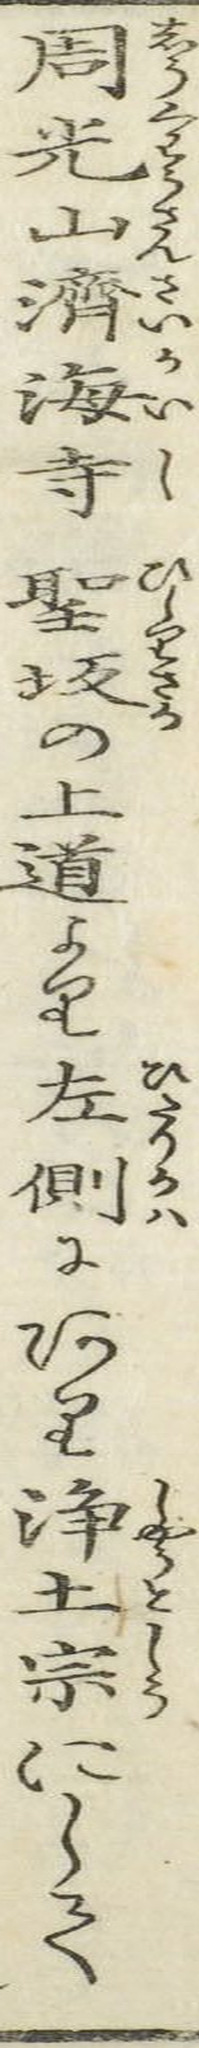周光山済海寺聖坂の上道より左側にあり浄土宗にして
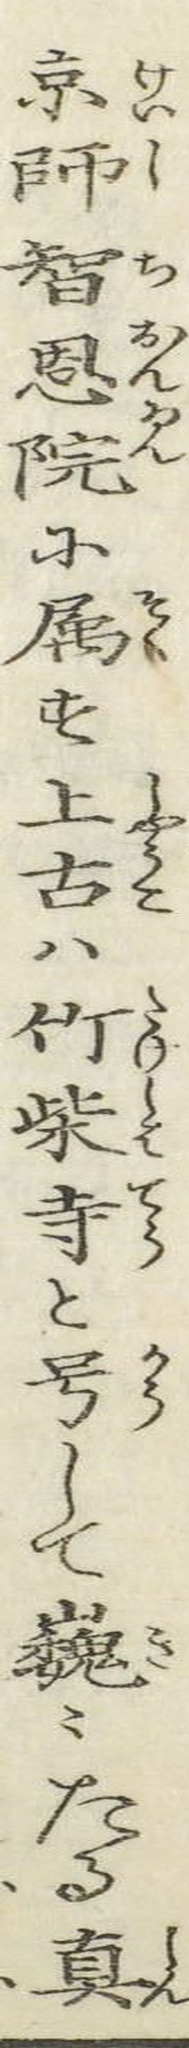京師智恩院に属す上古は竹柴寺と号して巍々たる真
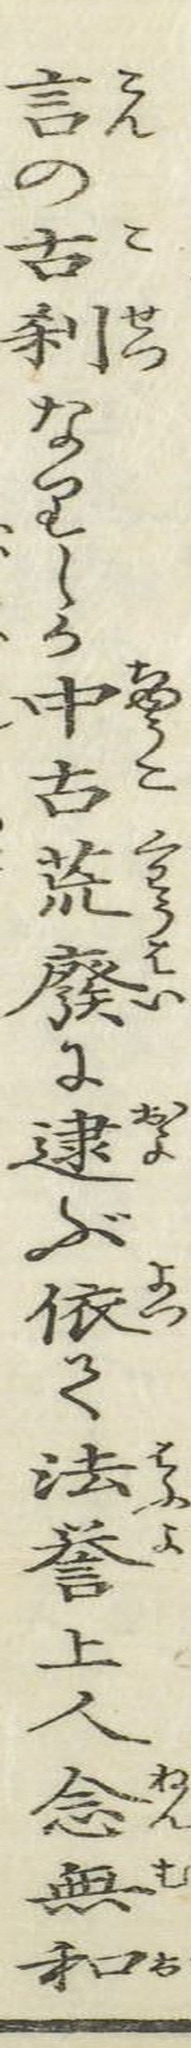言の古刹なりしか中古荒廃に逮ぶ依て法誉上人念無和
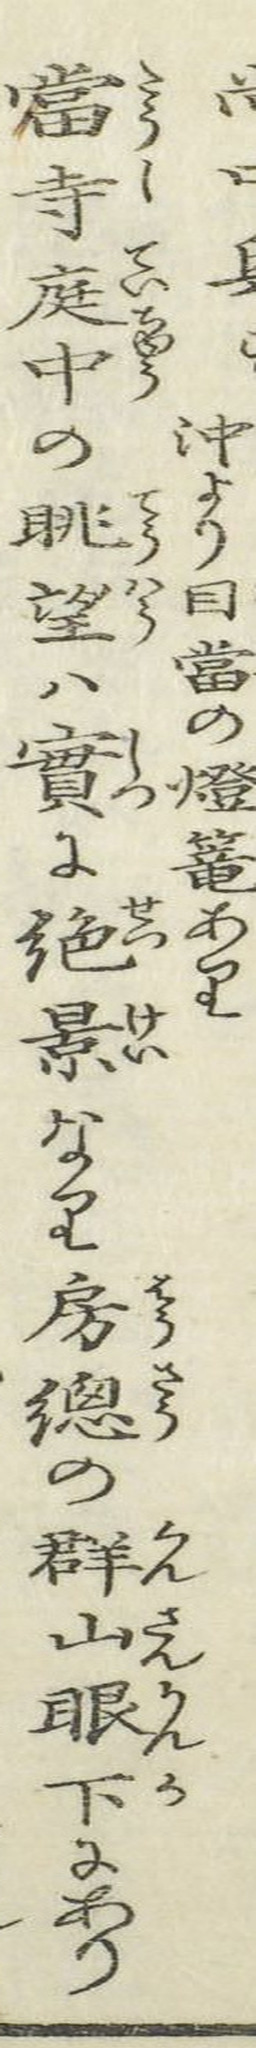當寺庭中の眺望は實に絶景なり房総の群山眼下にあり
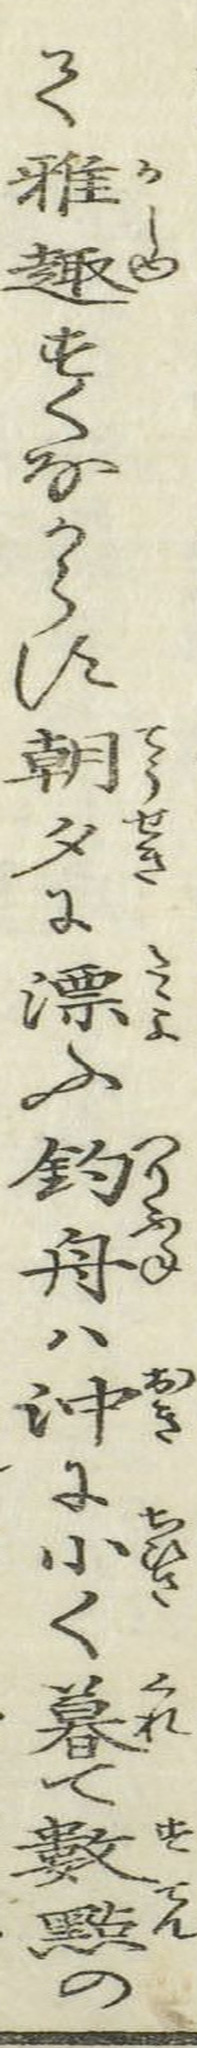て雅趣すくなからす朝夕に漂ふ釣舟は沖に小く暮て数點の
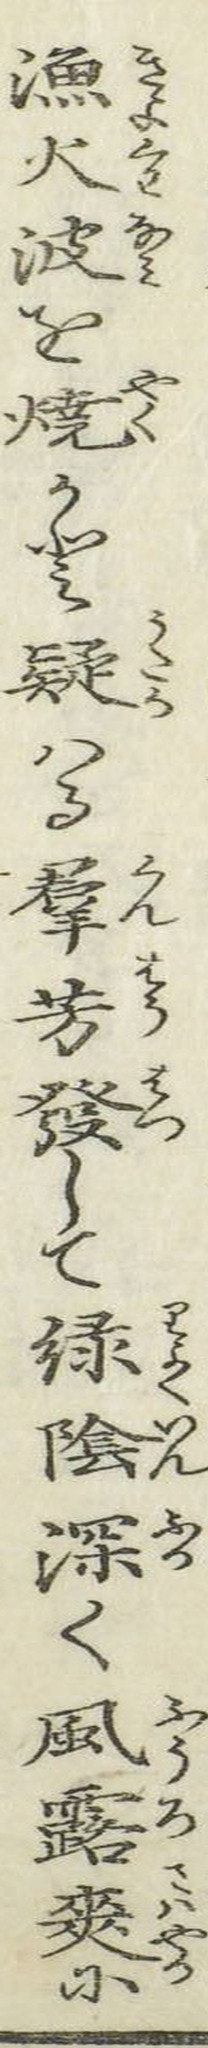漁火波を焼かと疑はる群芳發して緑陰深く風露爽に
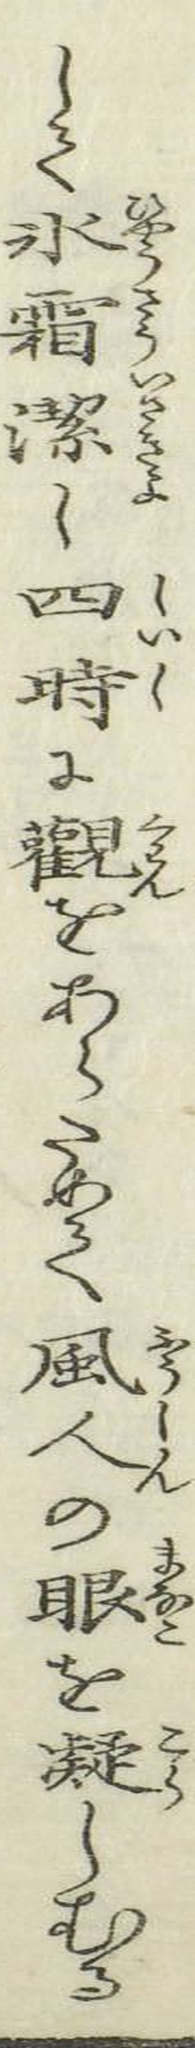して氷霜潔し四時に観をあらためて風人の眼を凝しむる
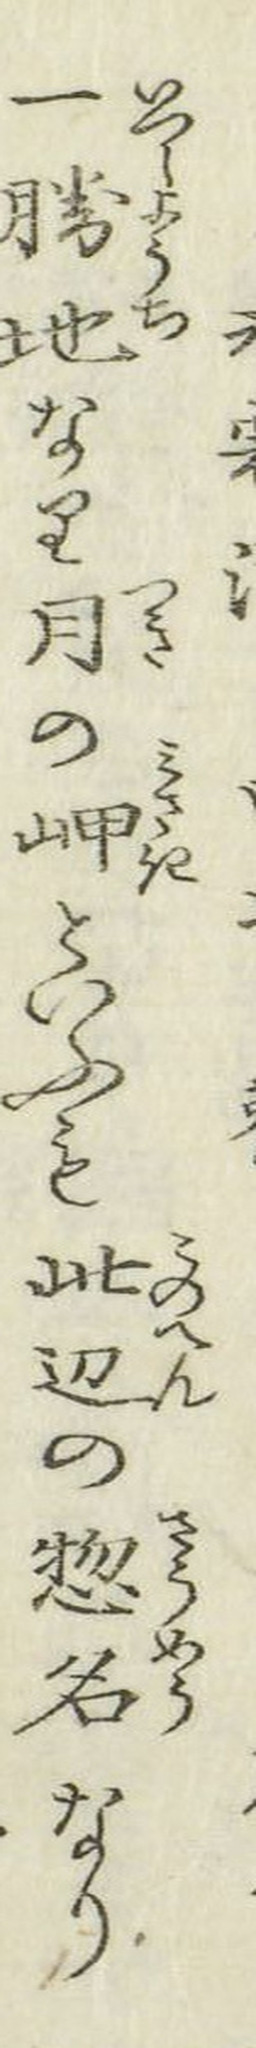一勝地なり月の岬といふも此辺の惣名なり
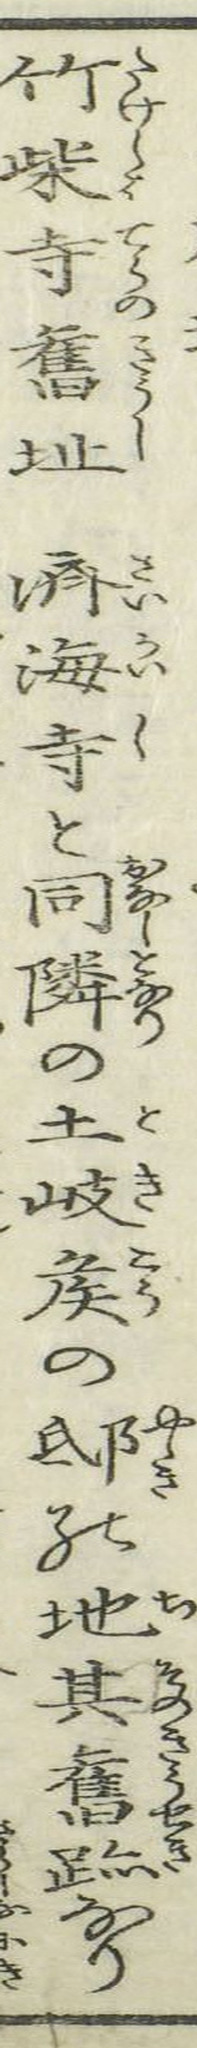竹柴寺舊址済海寺と同隣の土岐侯の邸の地其舊跡なり
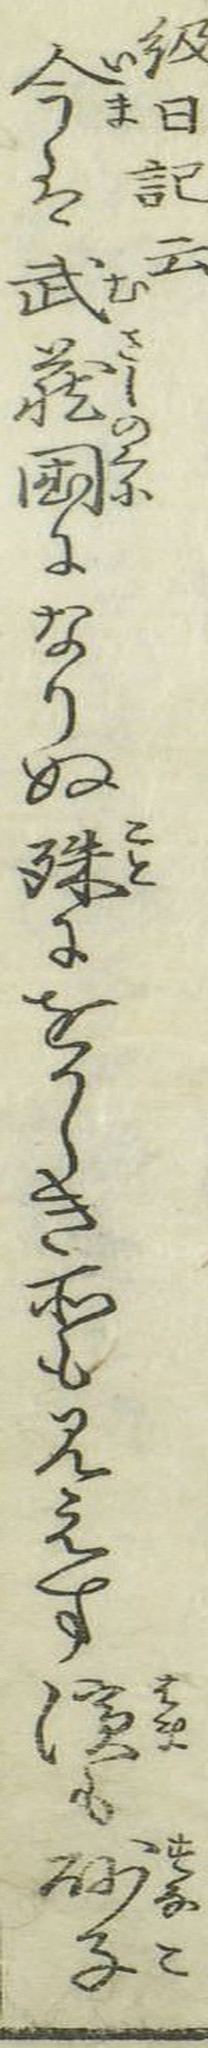今は武蔵國になりぬ殊にをかしき所も見えす濱も砂子
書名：江戸名所図会 20巻 巻之3
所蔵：東京学芸大学教育コンテンツアーカイブ
